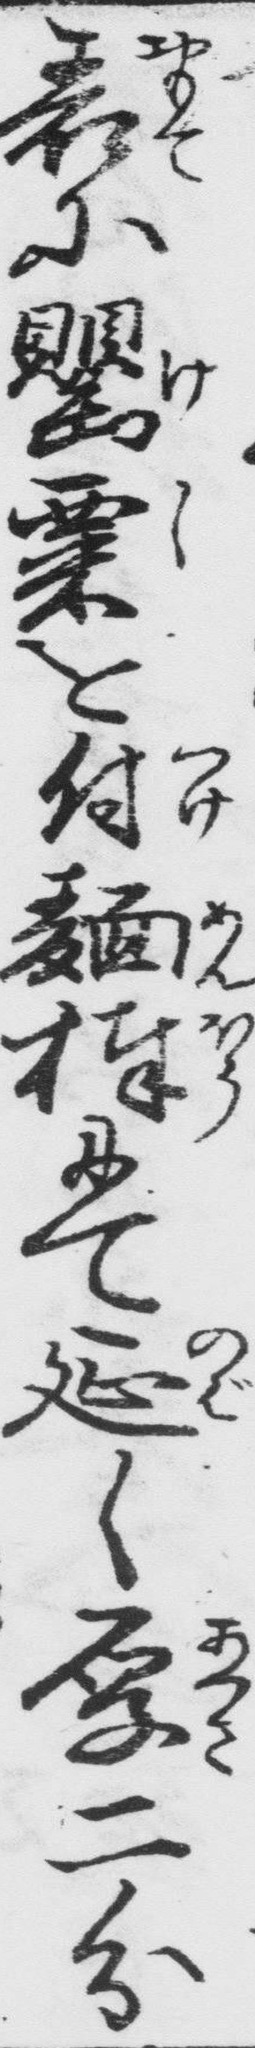表に罌粟を付麺棒にて延し厚二分
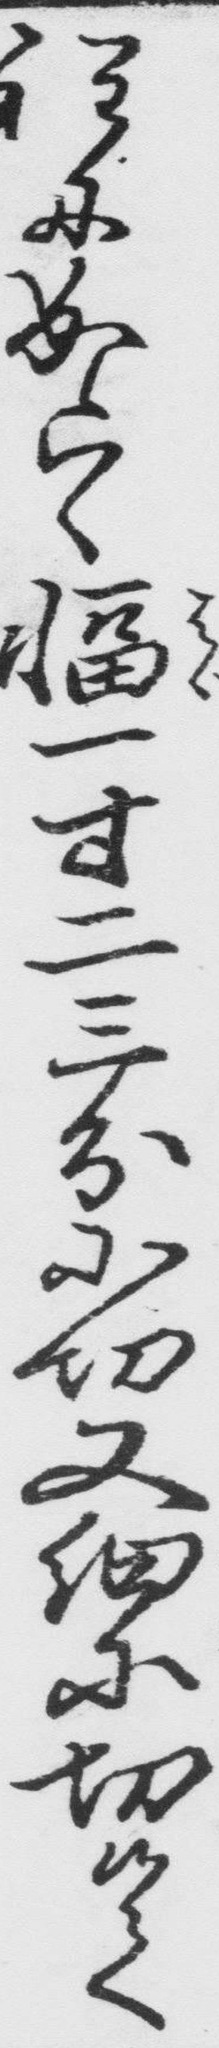程に成候はゝ幅一寸二三分に切又細に切候て
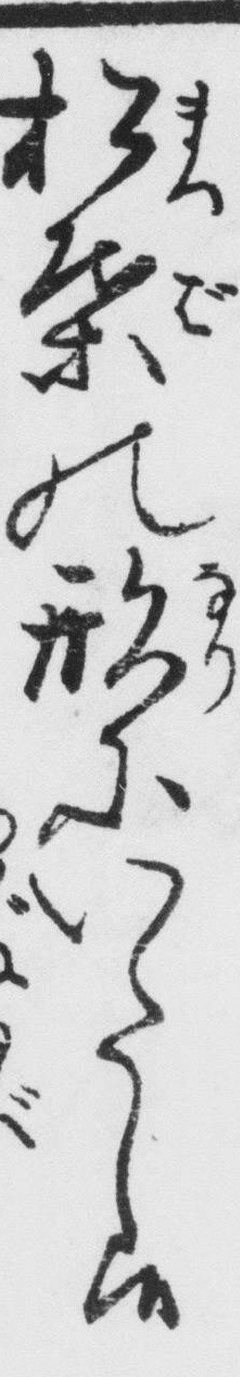松葉の形にいたし候
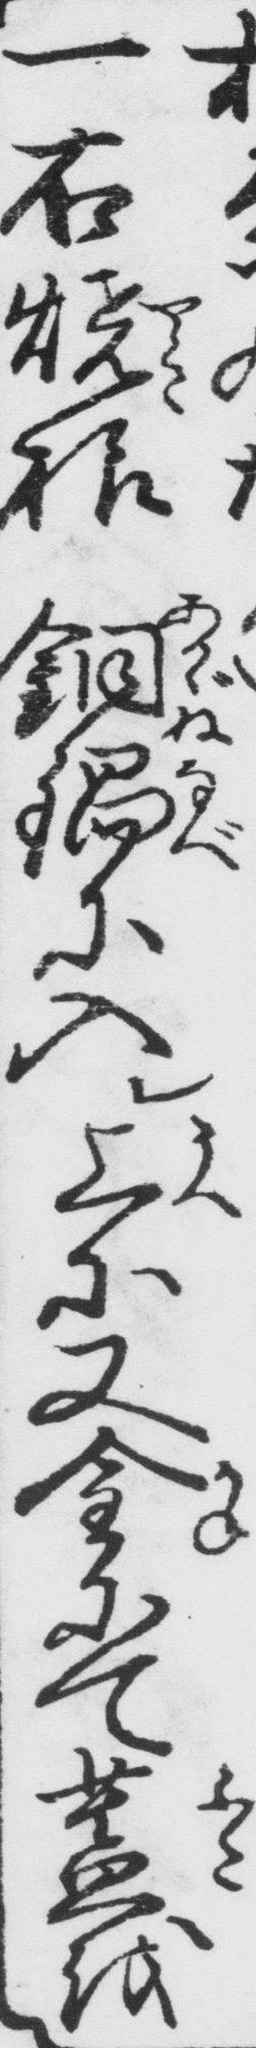一右焼様銅鍋に入れ上に又金にて蓋を

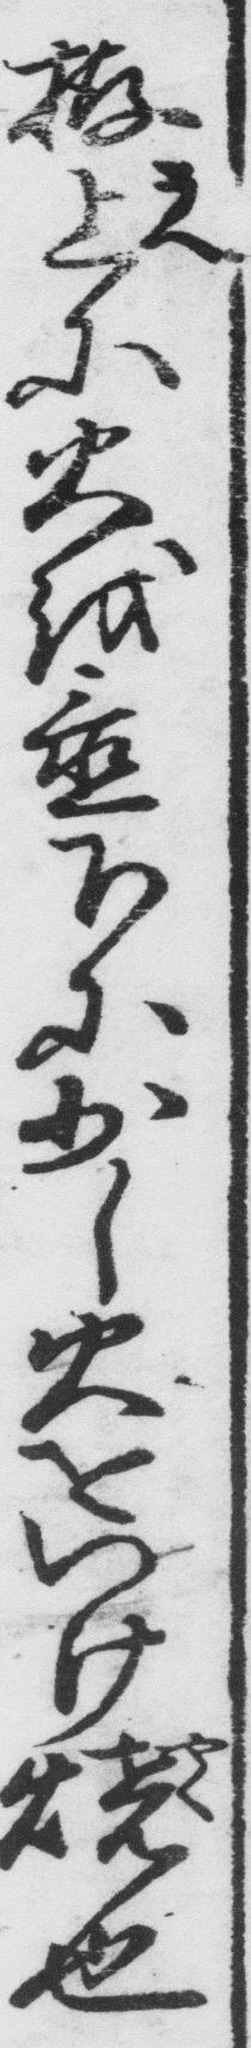拵上に火を置下に少し火をつけ焼也
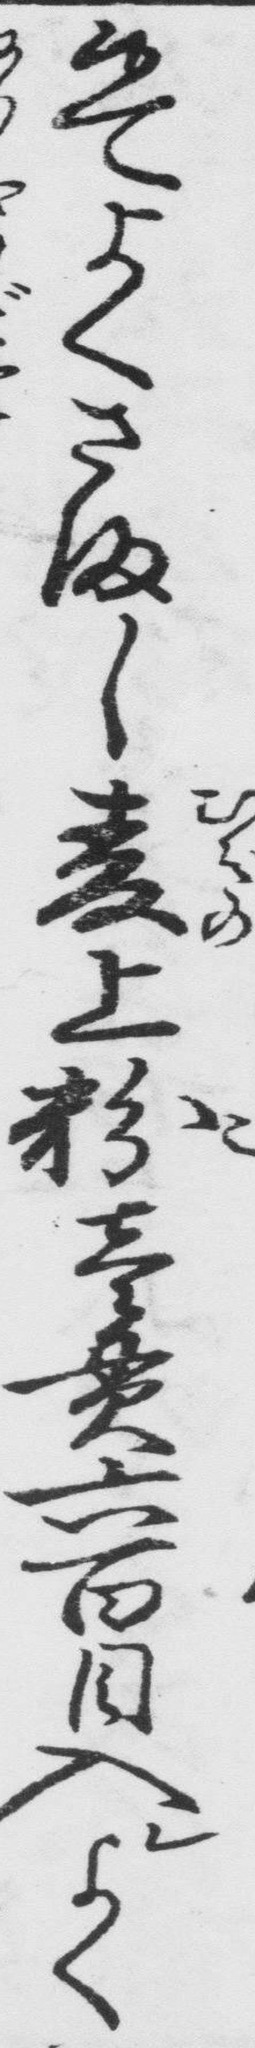候てよくさまし麦上粉壱貫六百目入れよく
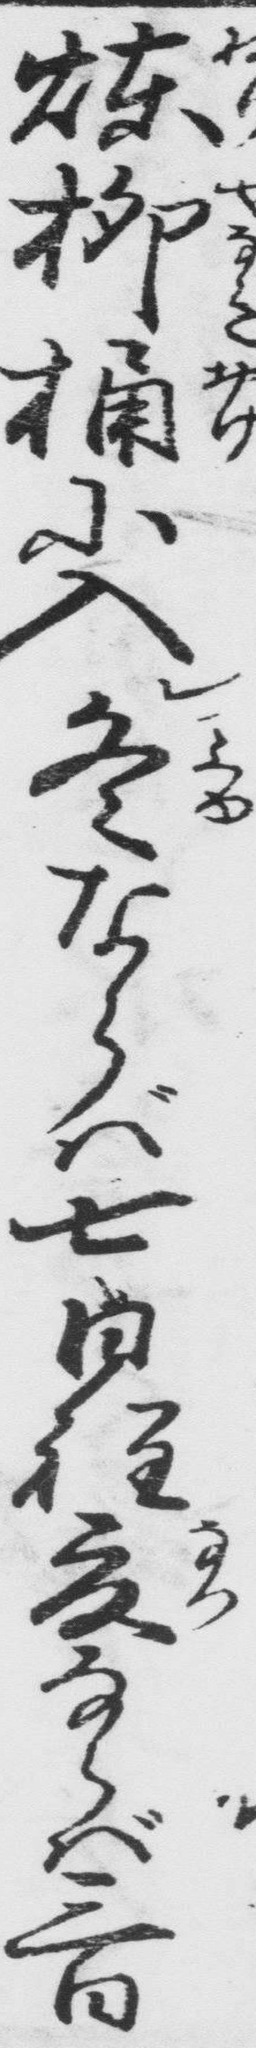煉柳桶に入れ冬ならば七日程夏ならば三日
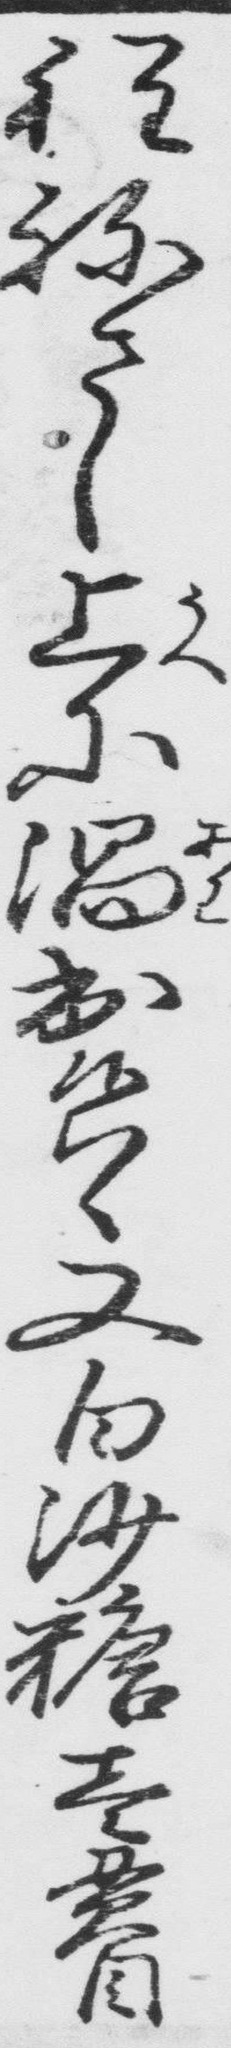程ねさし上に渦出候はゝ又白沙糖壱貫目
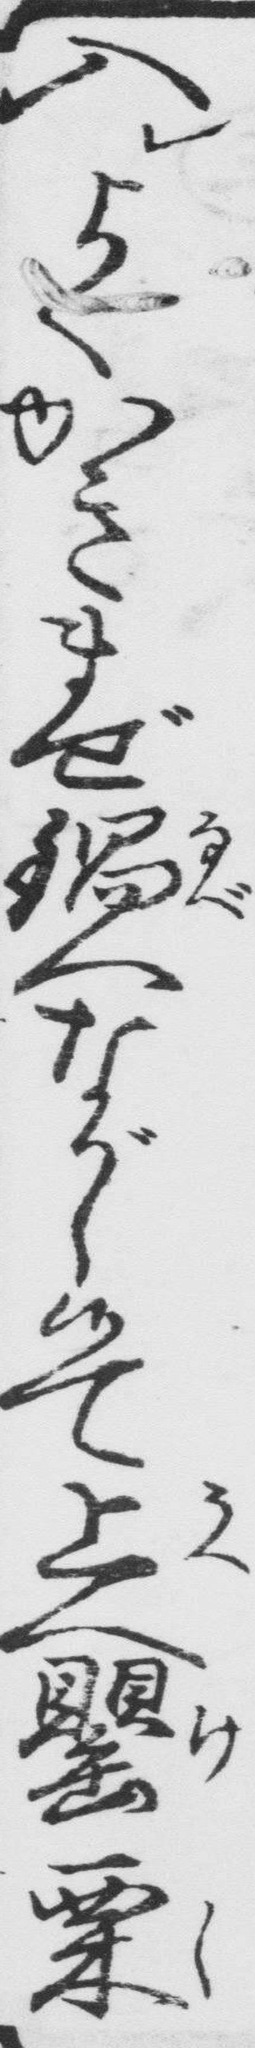入れよくかきまぜ鍋へながし候て上へ罌粟
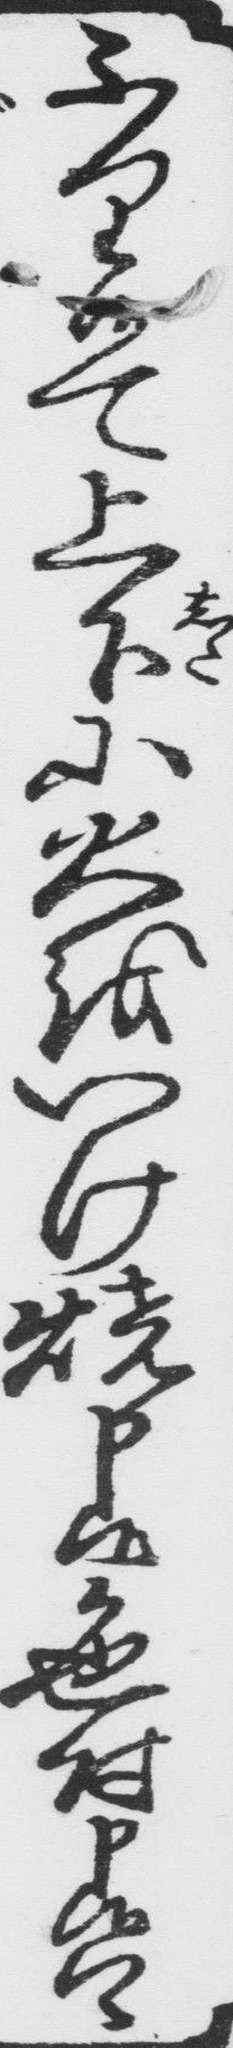ふり候て上下に火をつけ焼申候色付申候はゝ
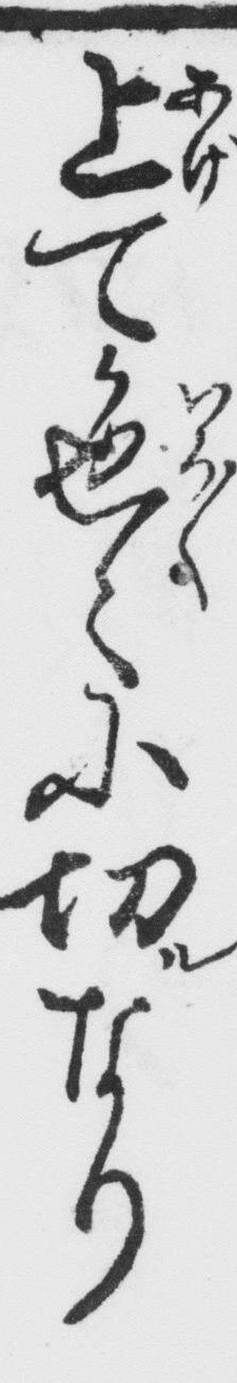上て色々に切るなり
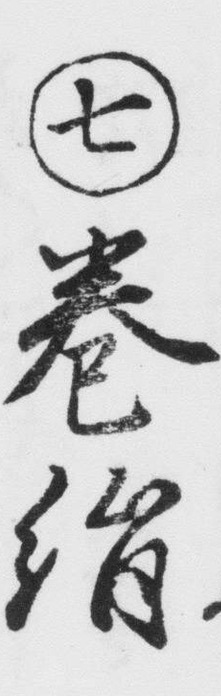(七)巻絹
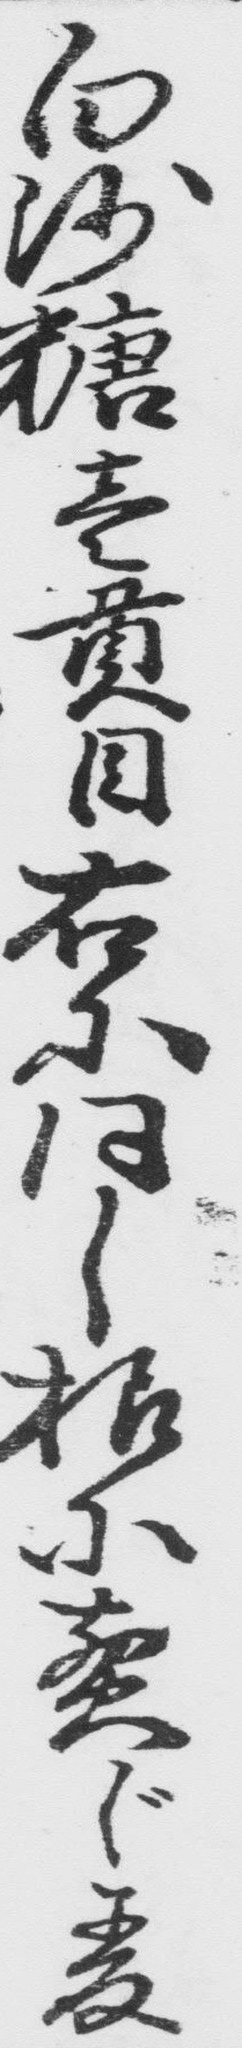白沙糖壱貫目右に同し様に煎じ麦
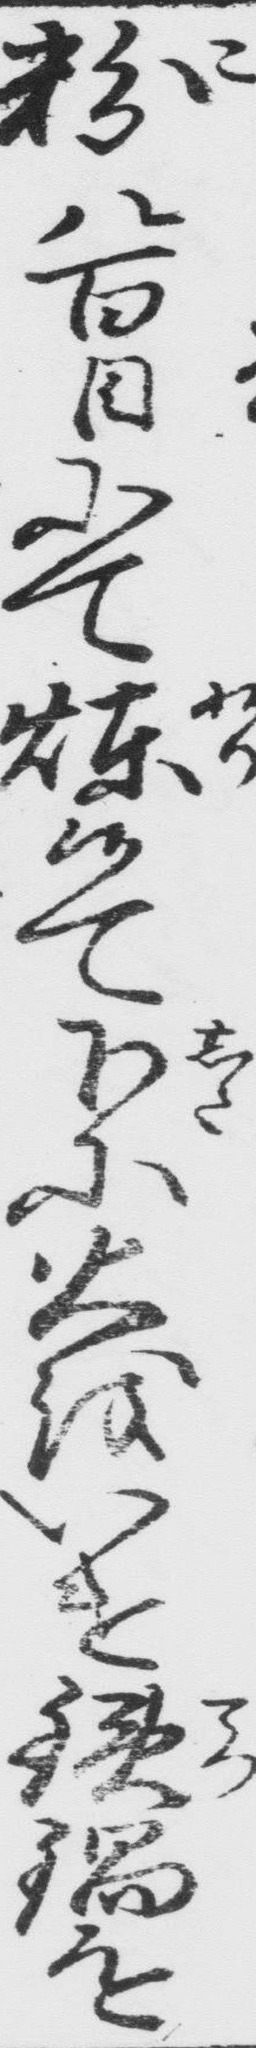粉八百目にて煉候て下に火をいれ鉄鍋を
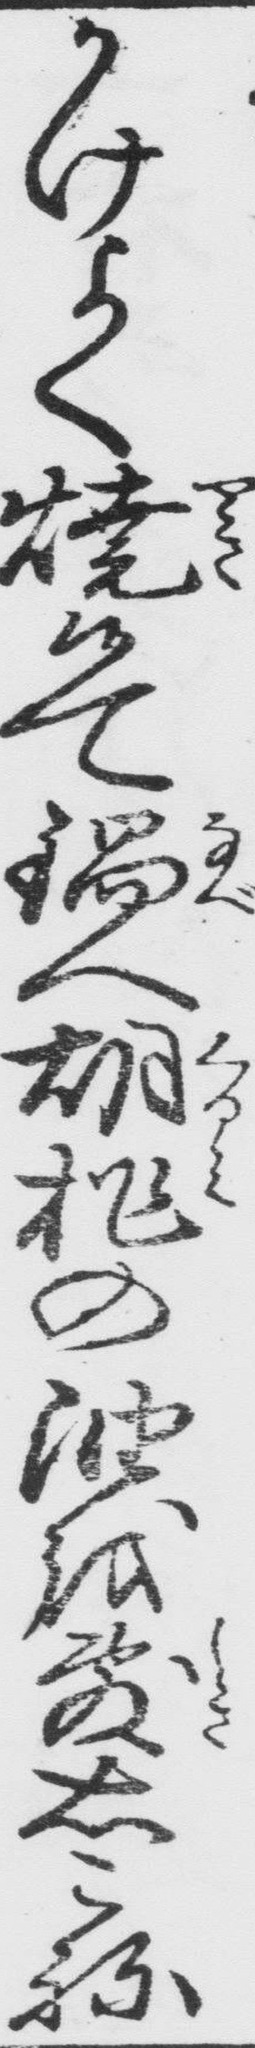かけよく焼候て鍋へ胡桃の油を敷右こね
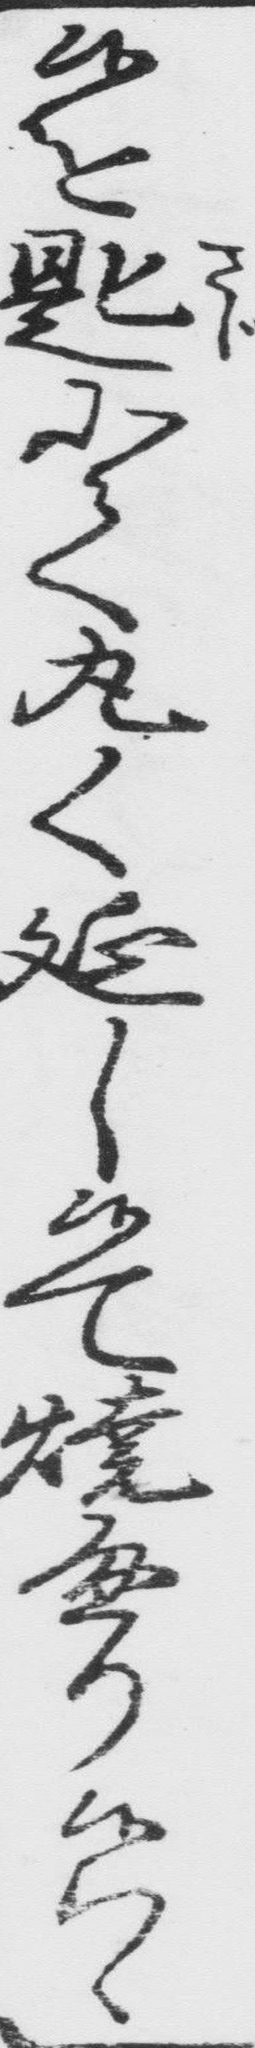候を匙にて丸く延し候て焼通り候はゝ
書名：御前菓子図式
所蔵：大阪府立大学学術情報センター 国文学研究資料館
